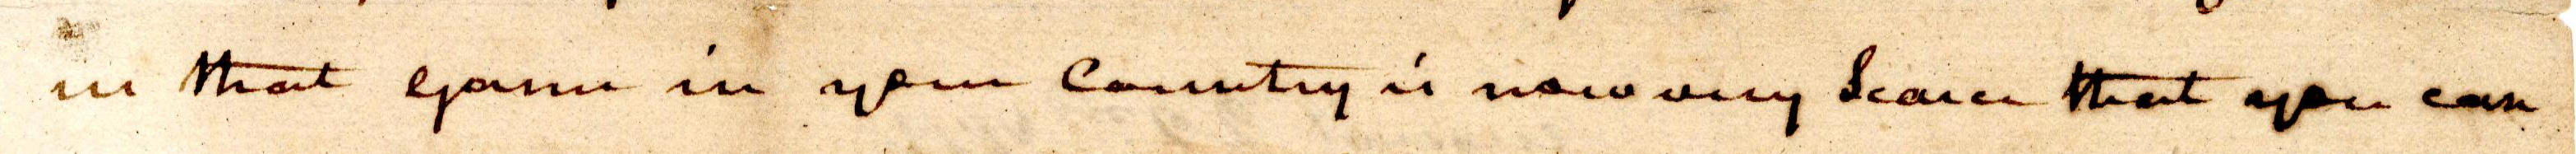us that Game in your Country is now very Scarce that you can
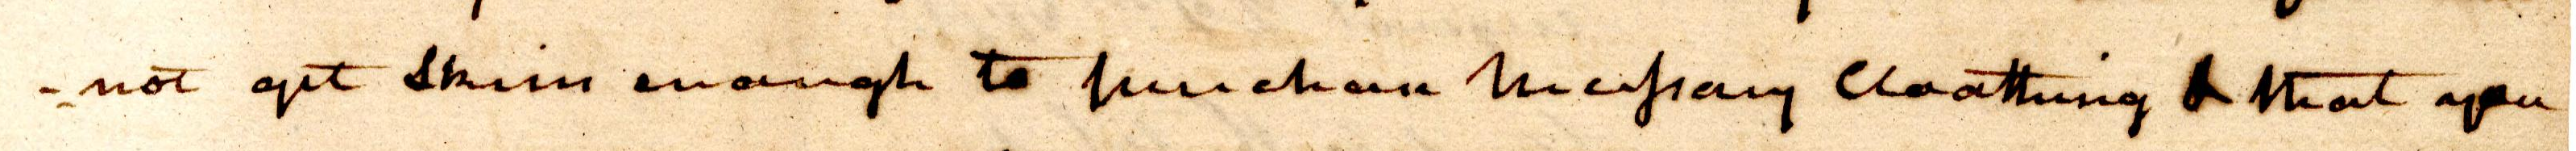-not yet Skin enough to purchase necessary Cloathing & that you
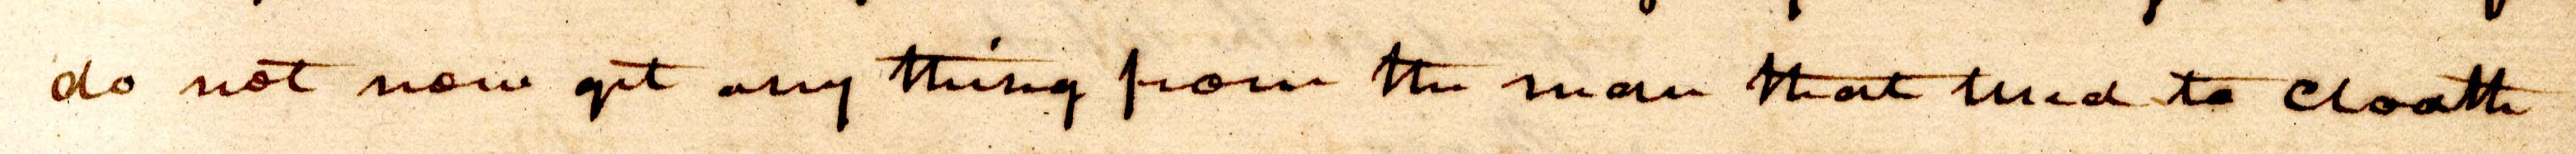do not now get any thing from the man that tried to Cloath
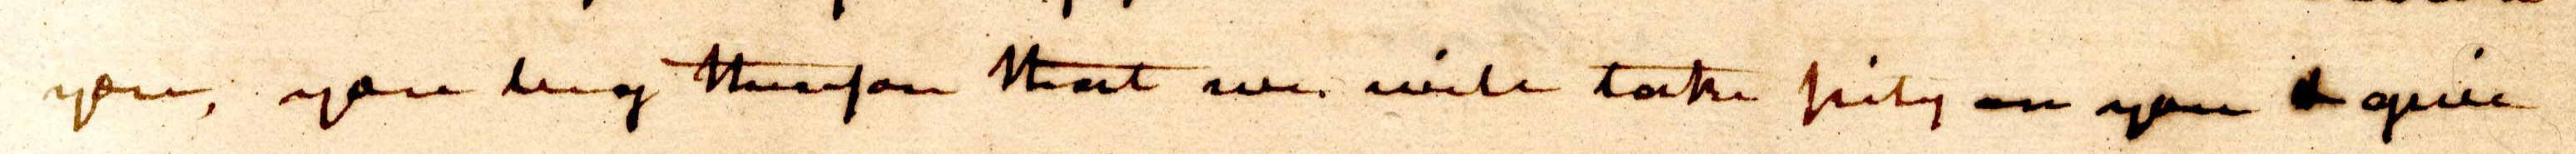you, you beg therefore that we will take pity on you & give
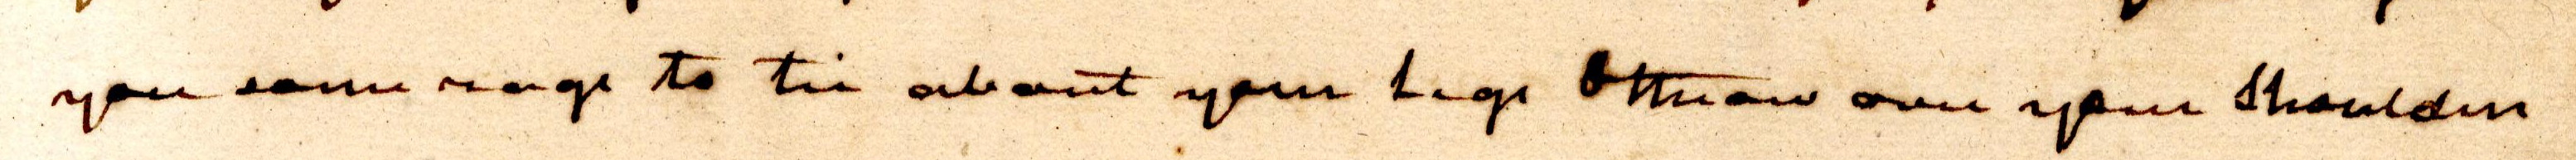you some rags to tie about your Legs & throw over your Shoulder
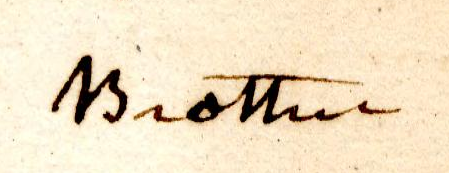Brother
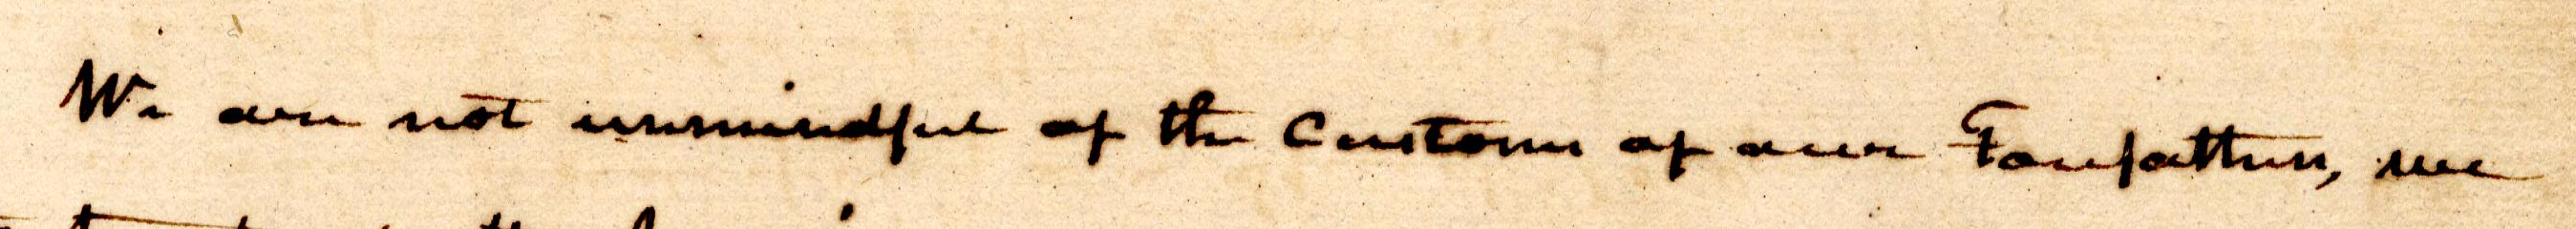We are not unmindful of the Customs of our Forefathers, we
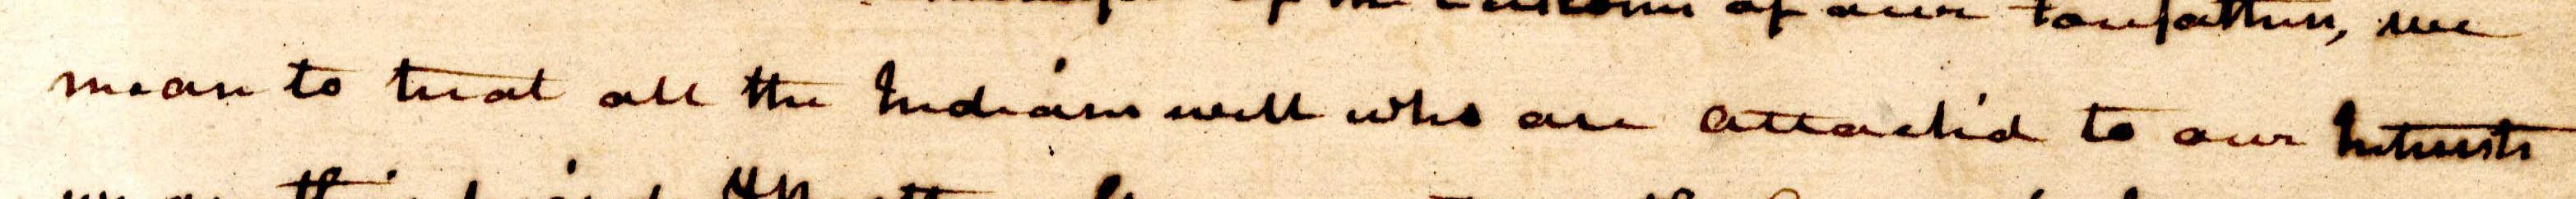mean to treat all the Indians well who are attach'd to our Interests
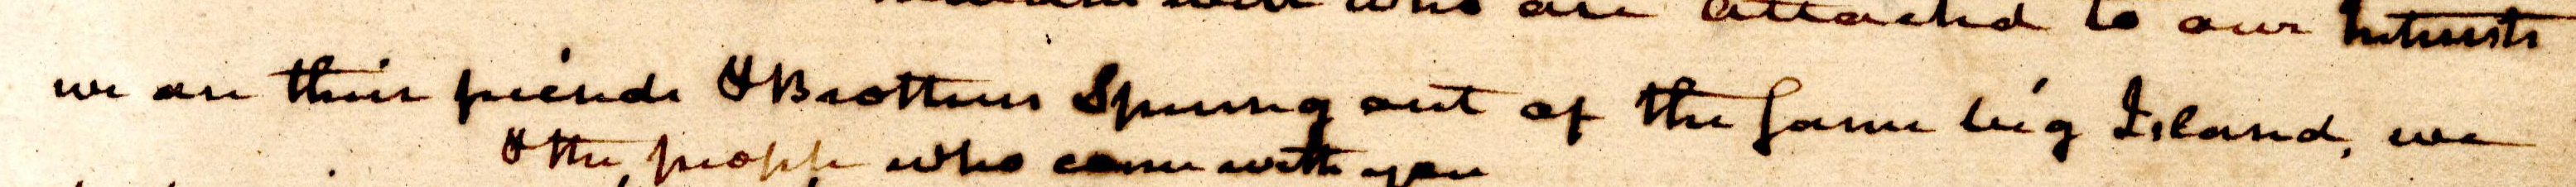we are their friends & Brothers Sprung out of the Same big Island, we
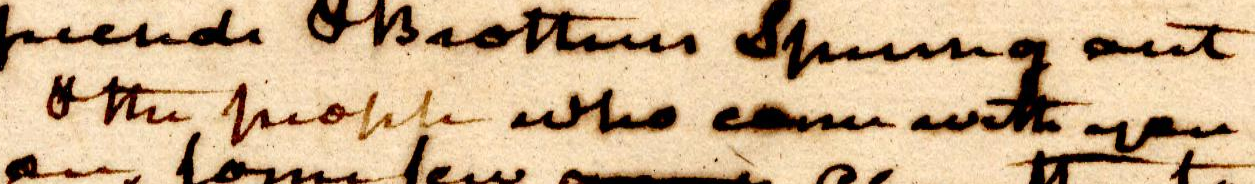& the people who came with you
